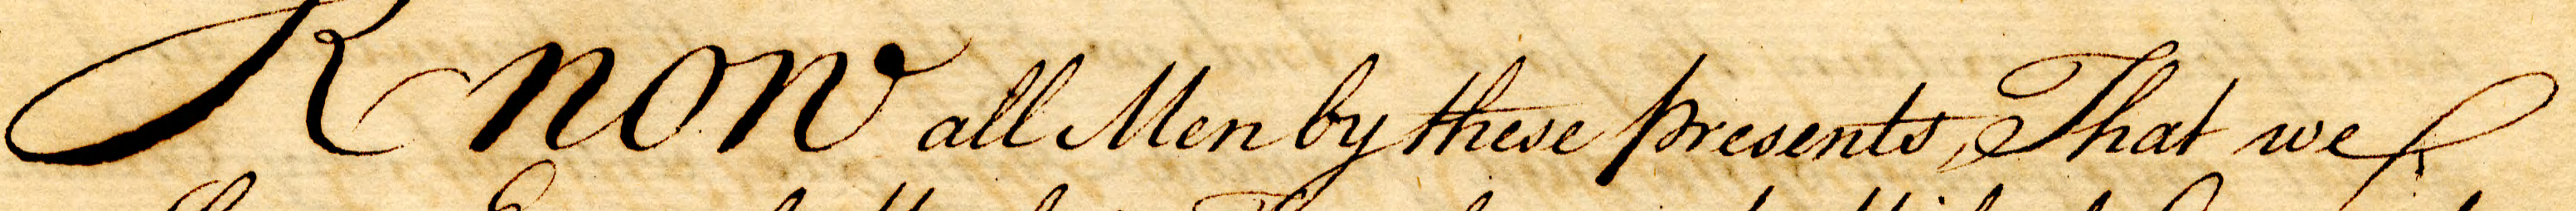Know all Men by these presents, That we,
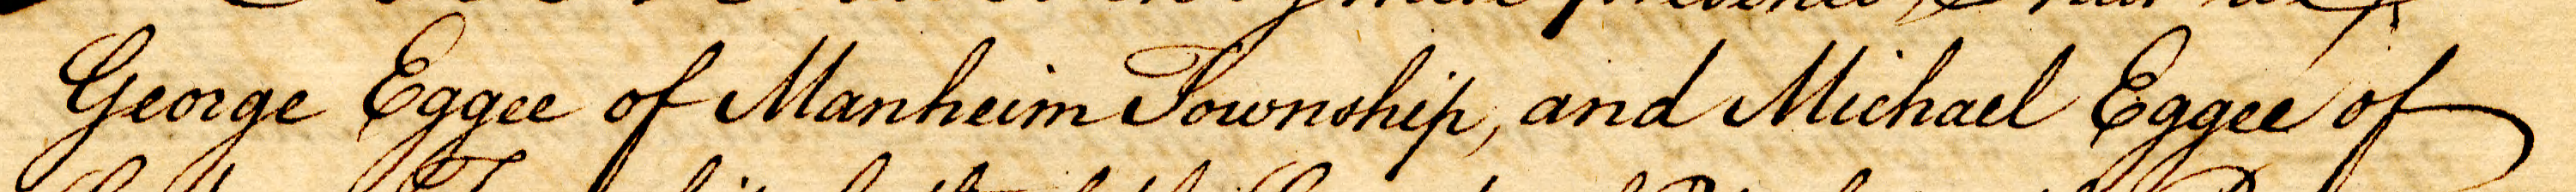George Eggee of Manheim Township, and Michael Eggee of
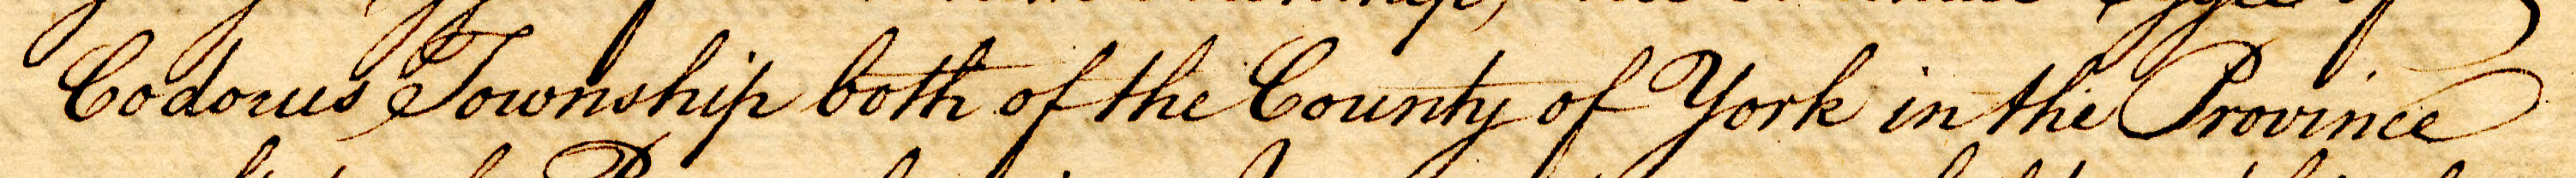Codorus Township both of the Country of York in the Province
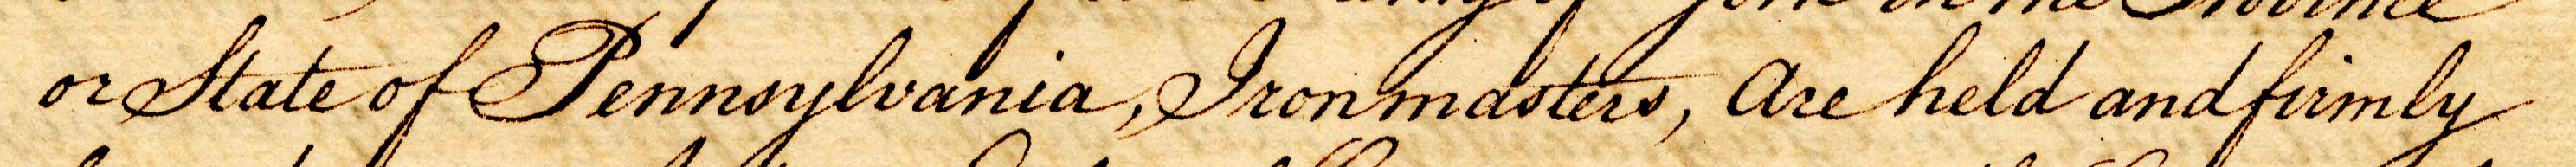or State of Pennsylvania, Ironmasters, are held and firmly
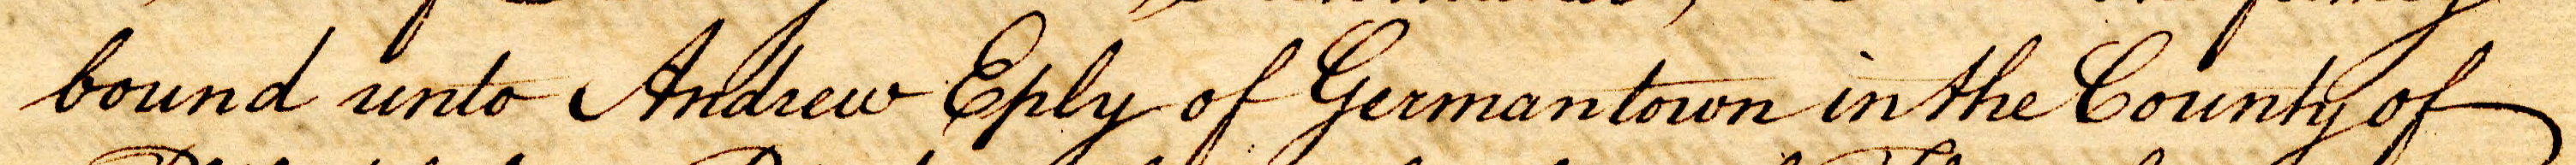bound unto Andrew Eply of Germantown in the County of
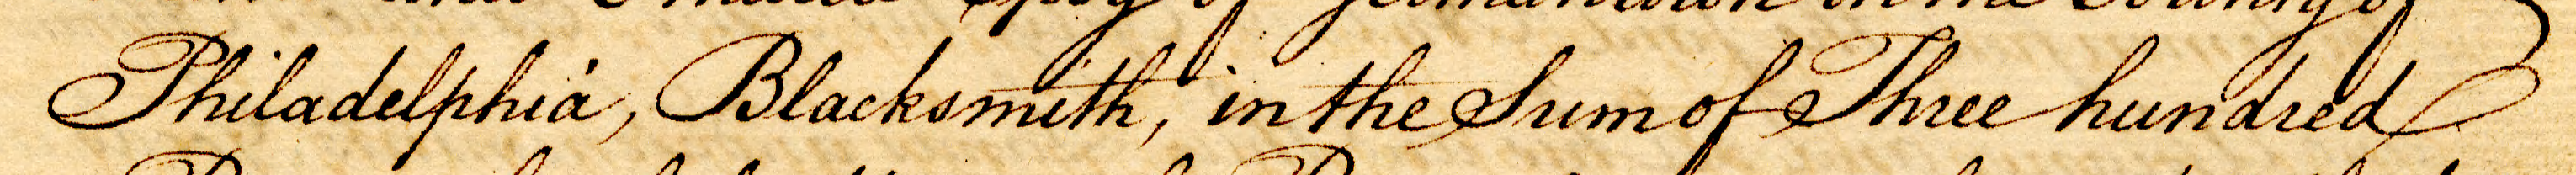Philadelphia, Blacksmith, in the Sum of Three hundred
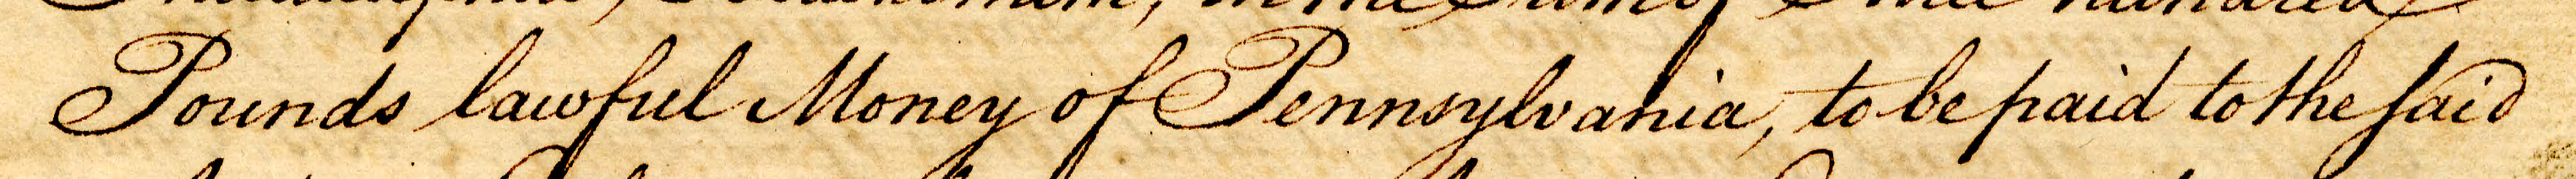Pounds lawful Money of Pennsylvania, to be paid to the said
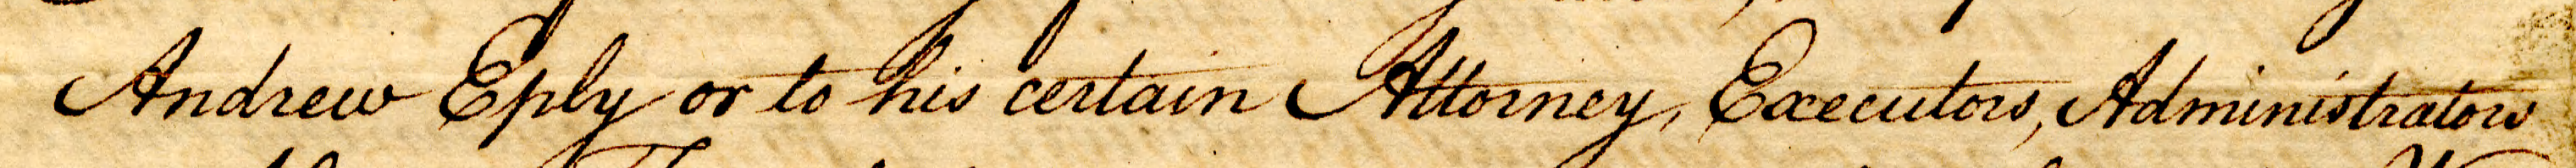Andrew Eply or to his certain Attorney, Executors, Administrators
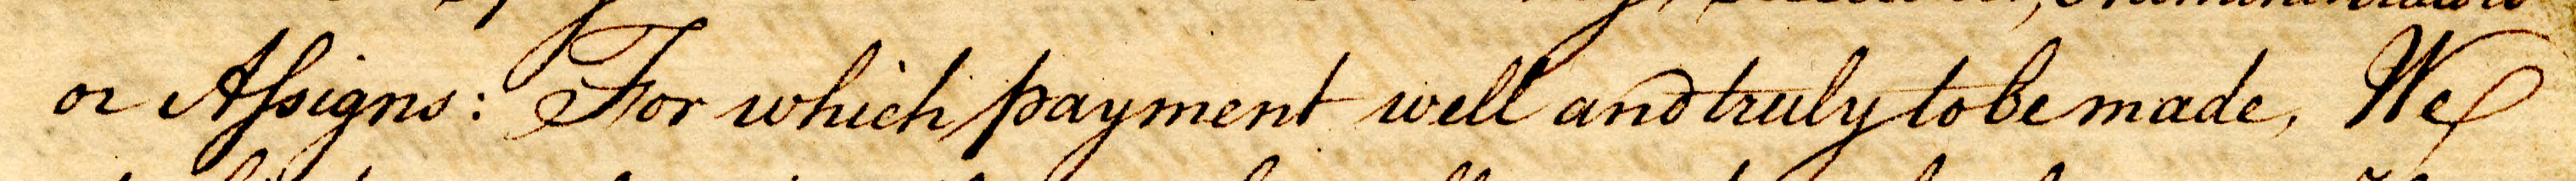or Assigns: For which payment well and truly to be made, We
